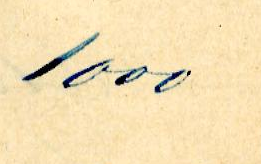1000
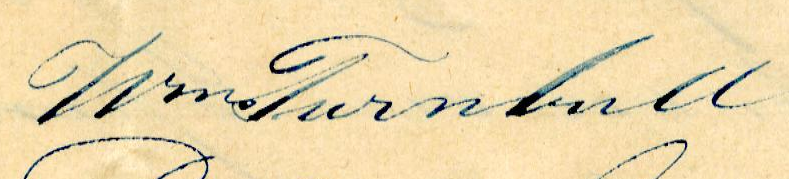W^m Turnbull
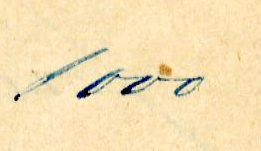1000
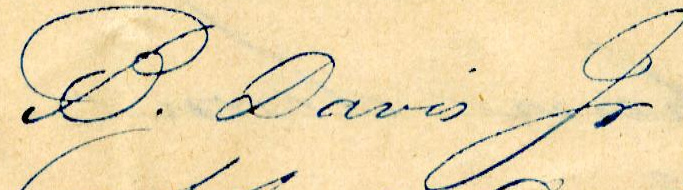B. Davis Jr
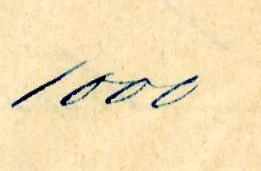1000
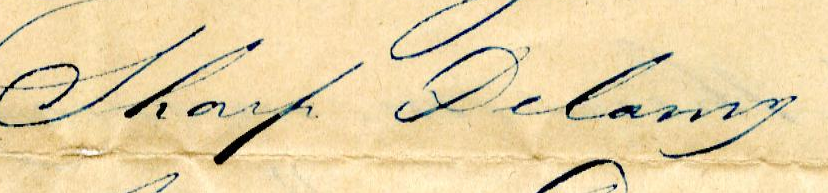Sharp Delany
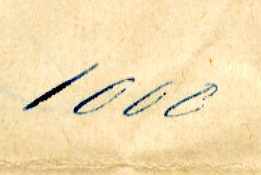1000
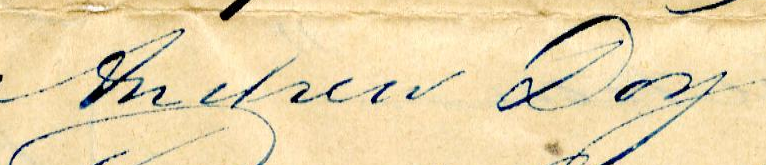Andrew Day
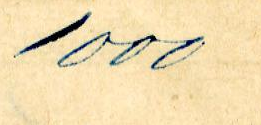1000
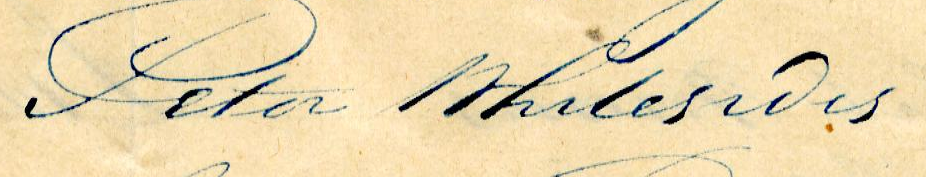Peter Whitesides
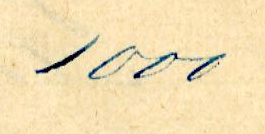1000
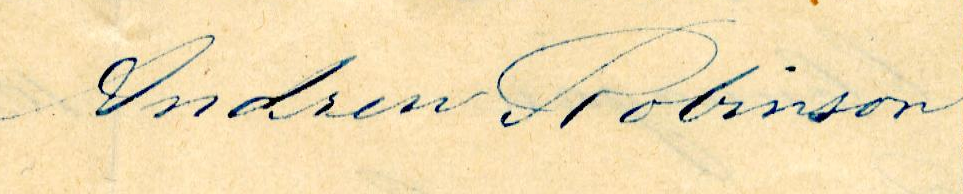Andrew Robinson
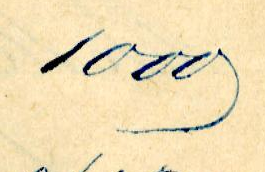1000
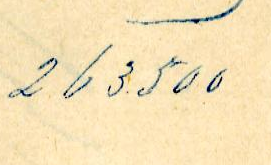263.500
